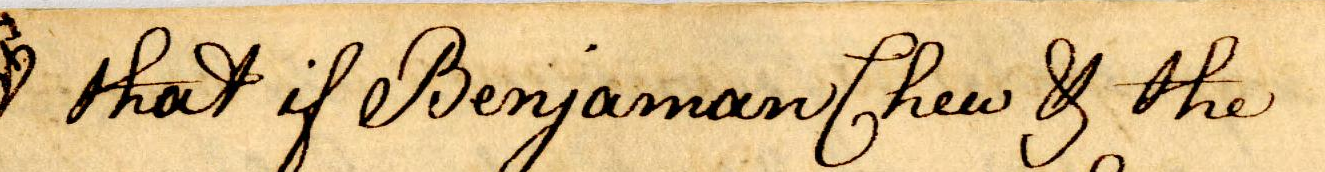that if Benjamin Chew & the
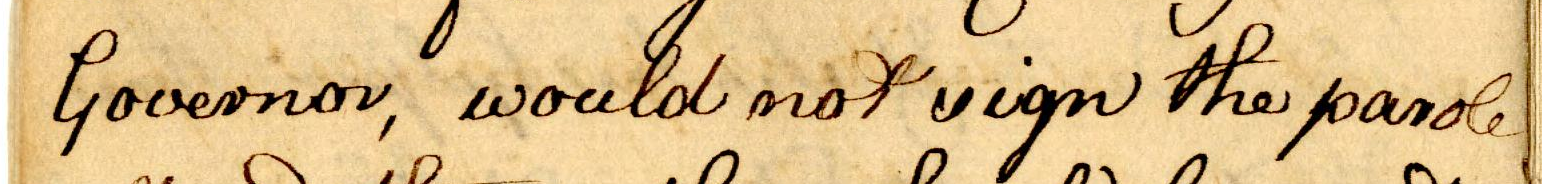Governor, would not sign the parole
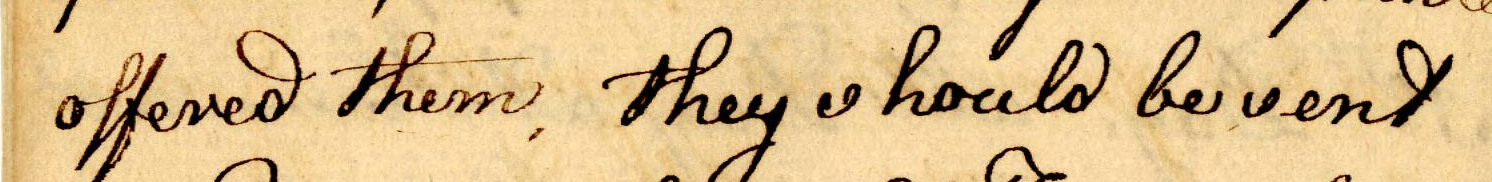offered them, they should be sent
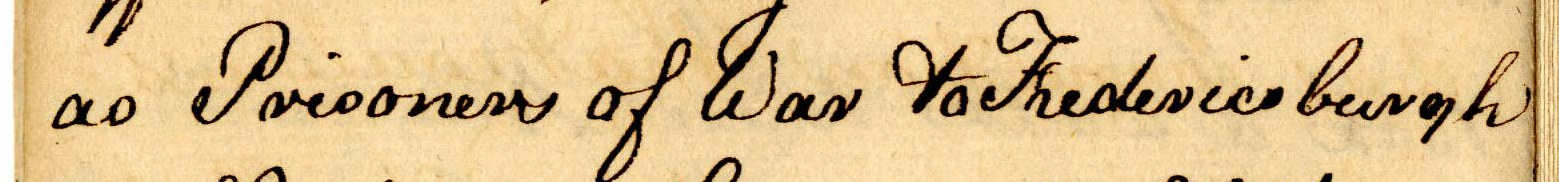as Prisoners of War to Fredericsburgh
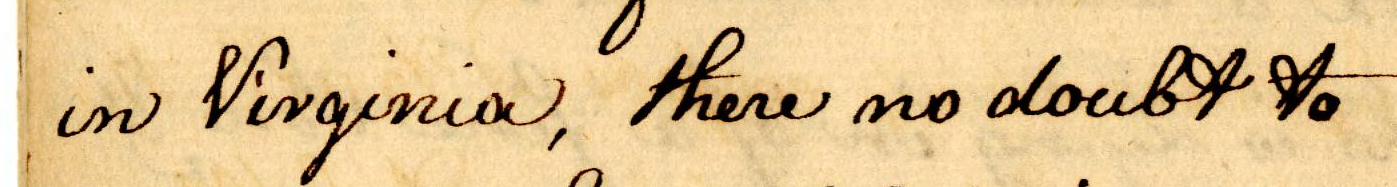in Virginia, there no doubt to
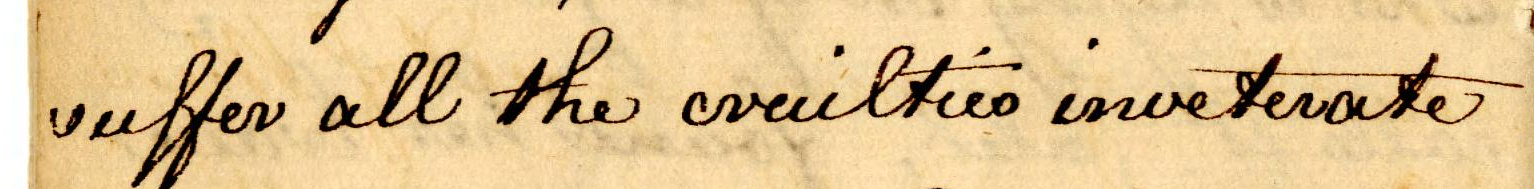suffer all the cruilties inveterate
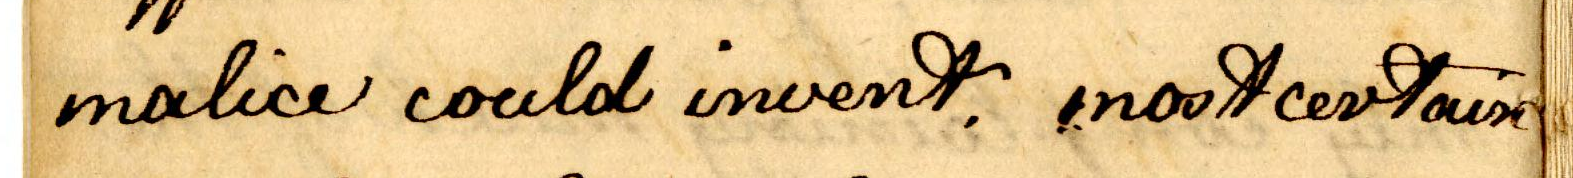malice could invent. most certain
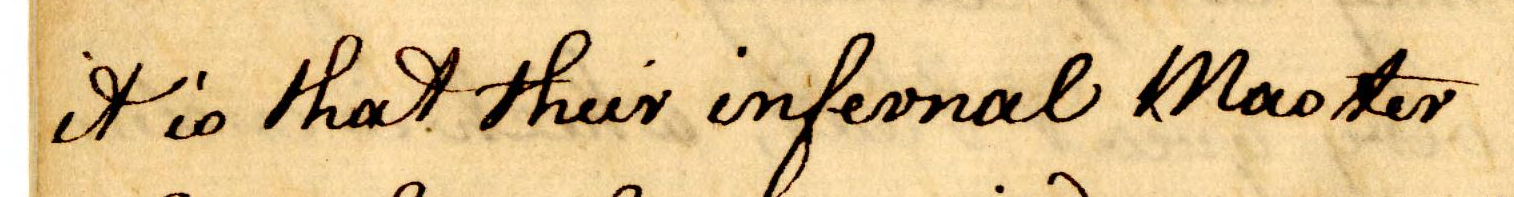it is that their infernal Master
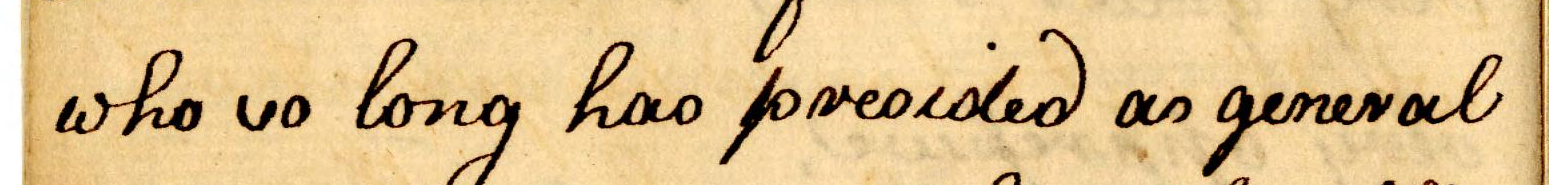who so long has presided as general
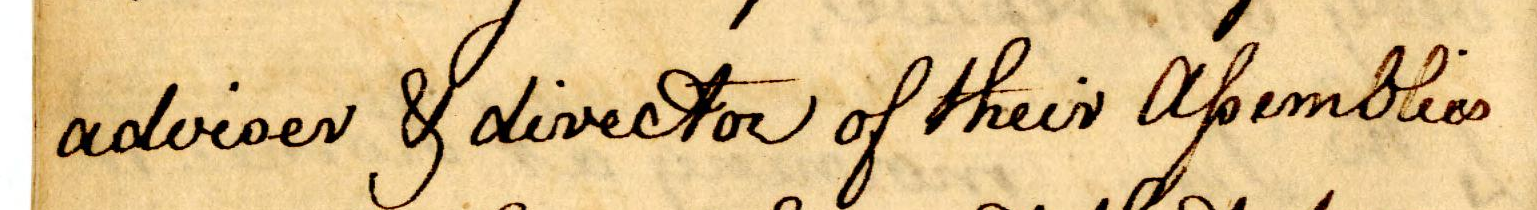adviser & director of their Assemblies
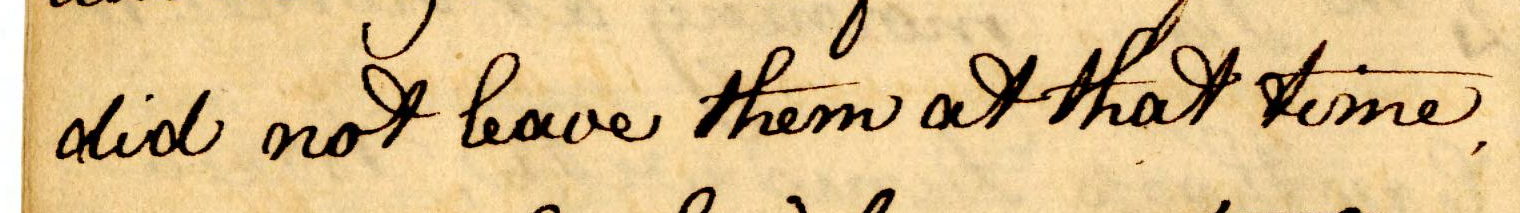did not have them at that time,
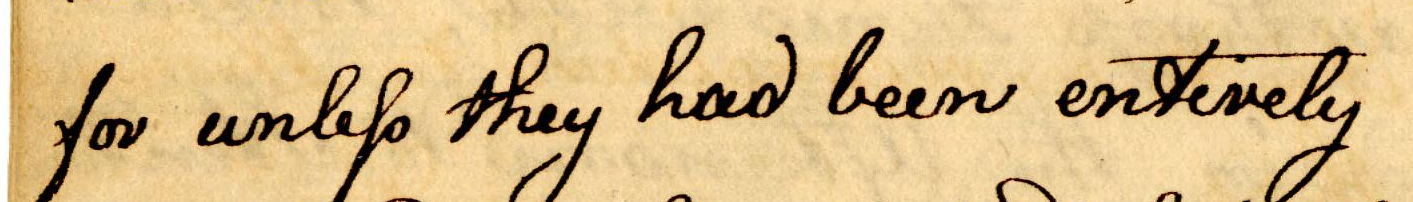for unless they had been entirely
